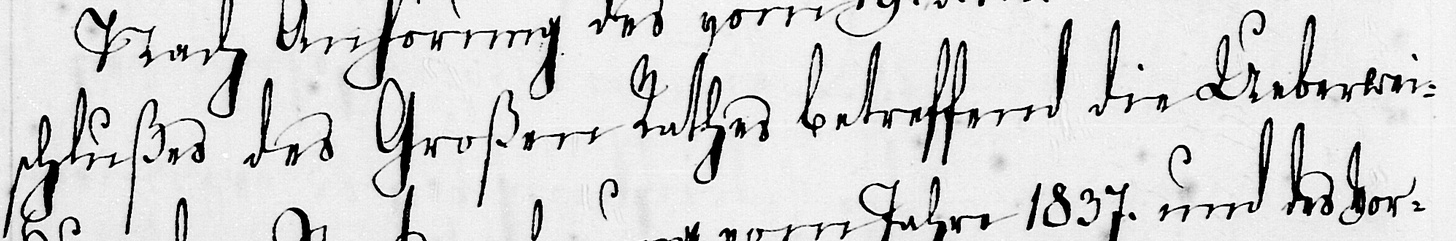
schlußes des Großen Rathes betreffend die Ueberwei¬
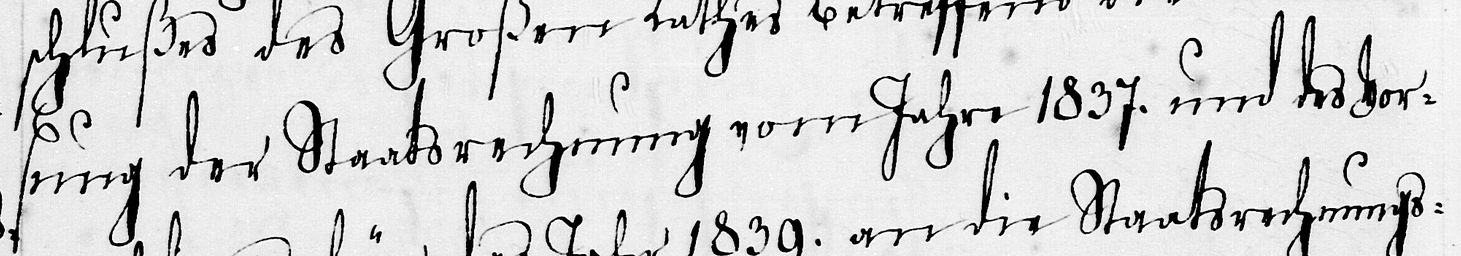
sung der Staatsrechnung vom Jahre 1837. und des Vor¬
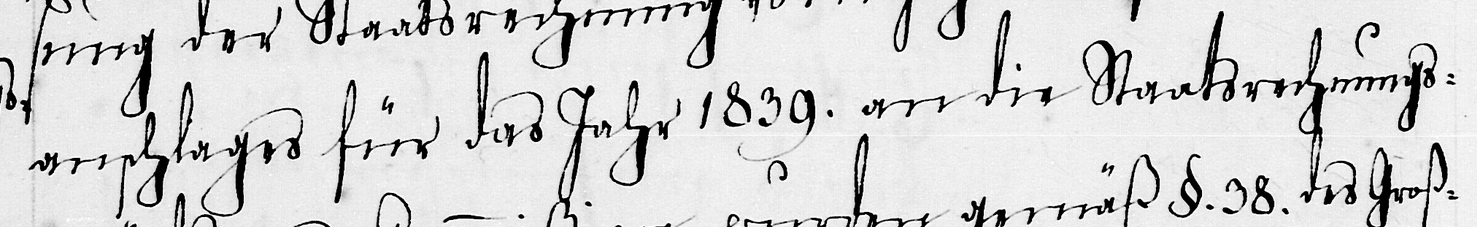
anschlages für das Jahr 1839. an die Staatsrechnungs¬
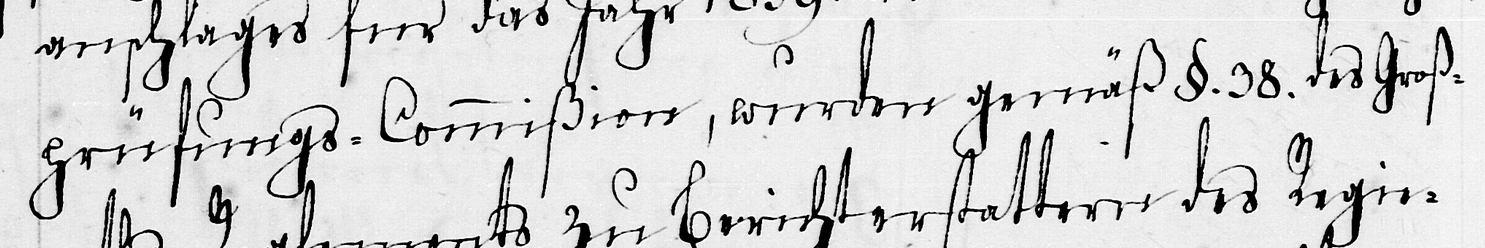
prüfungs-Commißon, wurden gemäß §. 38. des Groß¬
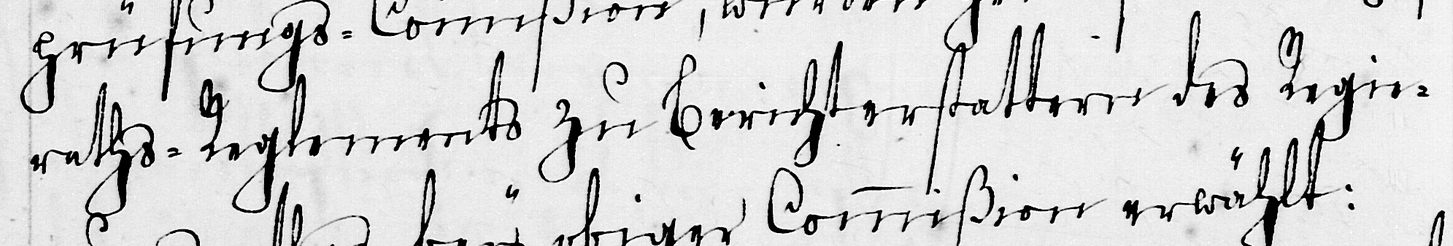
raths-Reglements zu Berichterstattern des Regie¬
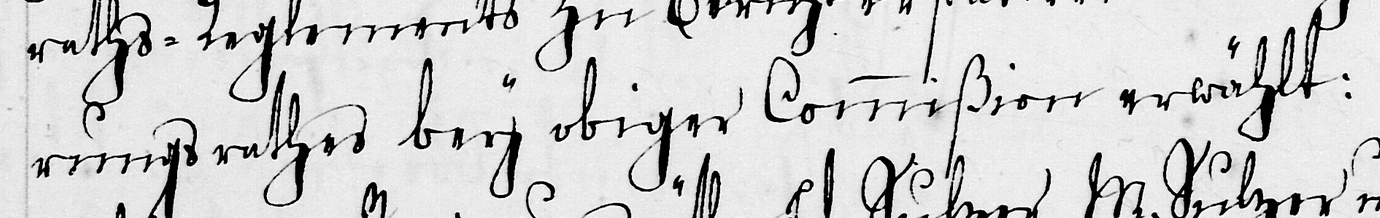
rungsrathes bey obiger Commißion erwählt:
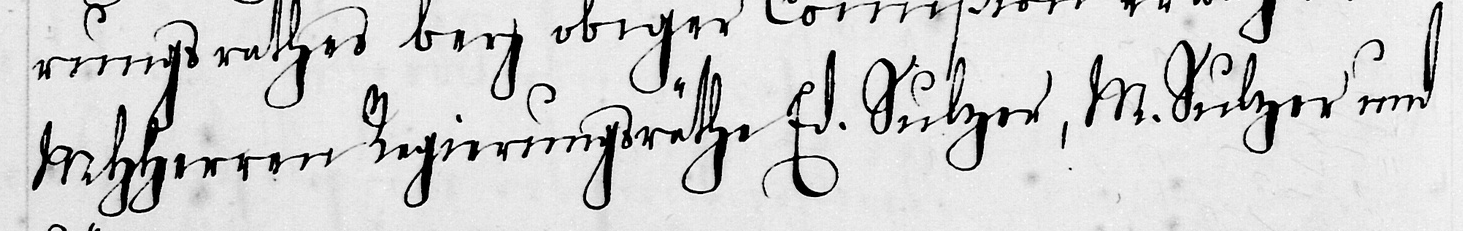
MHHerren Regierungsräthe Ed. Sulzer, M. Sulzer und
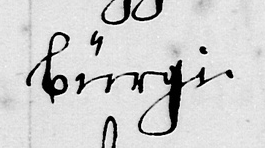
Bürgi.
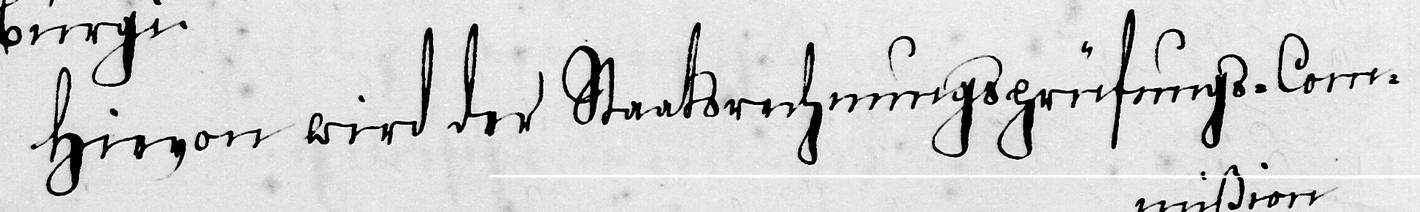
Hievon wird der Staatsrechnungsprüfungs-Com-
